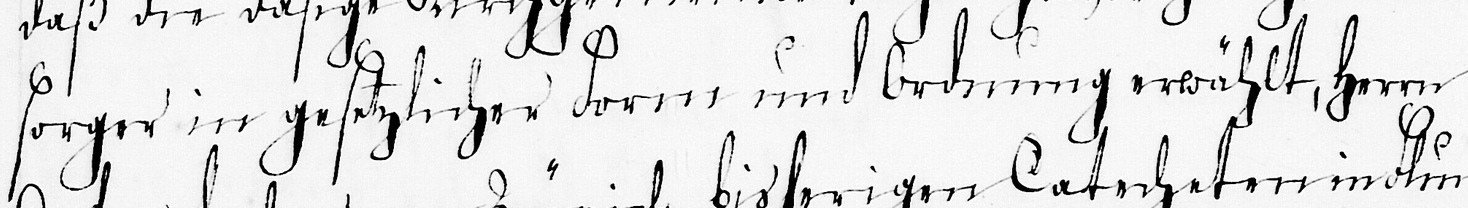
sorger in gesetzlicher Form und Ordnung erwählt, Herrn
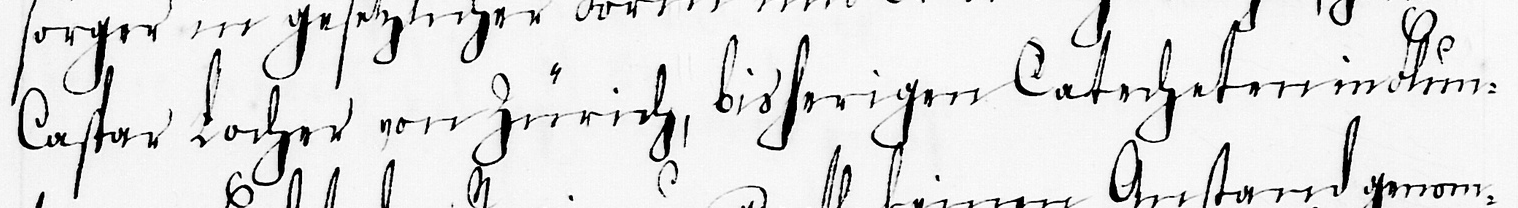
Caspar Locher von Zürich, bisherigen Catecheten in Flun¬
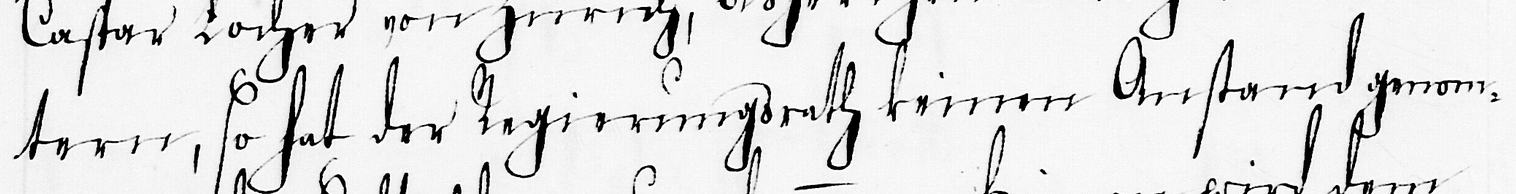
tern, so hat der Regierungsrath keinen Anstand genom¬
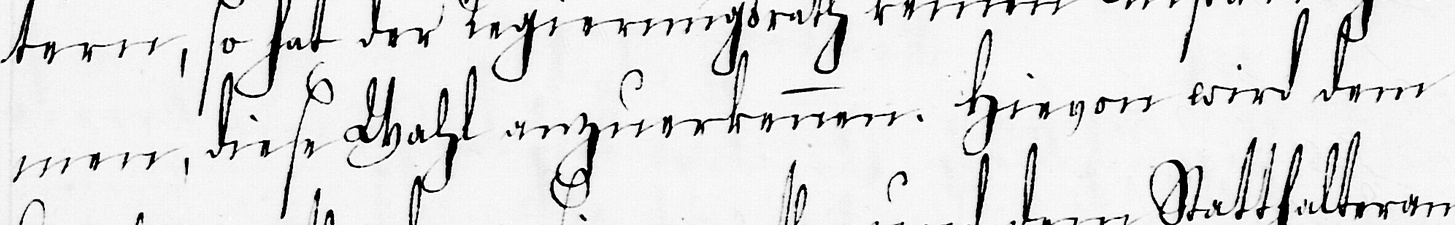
men, diese Wahl anzuerkennen. Hievon wird dem
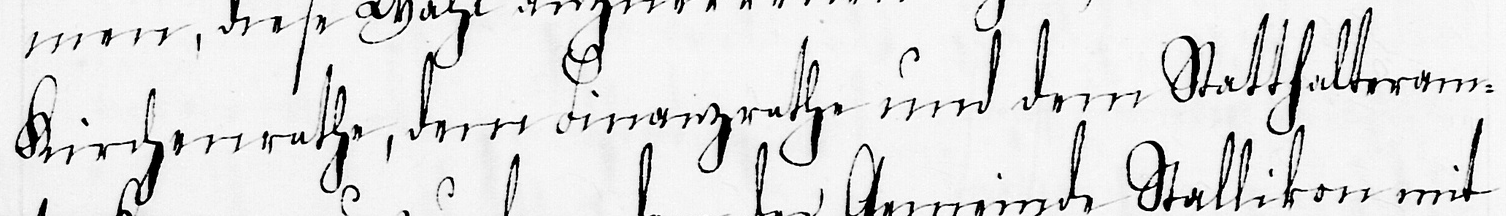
Kirchenrathe, dem Finanzrathe und dem Statthalteram¬
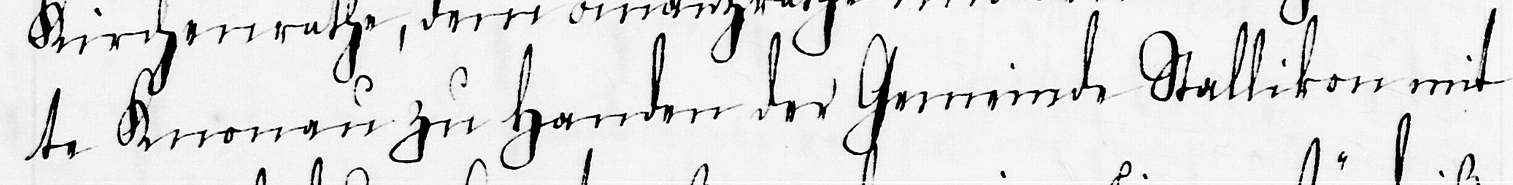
te Knonau zu Handen der Gemeinde Stallikon mit
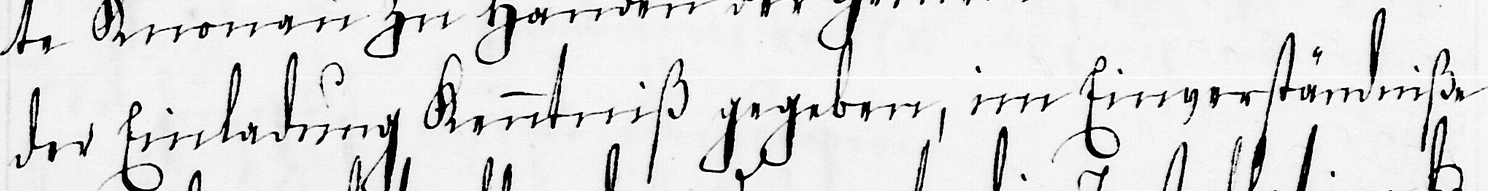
der Einladung Kenntniß gegeben, im Einverständniße
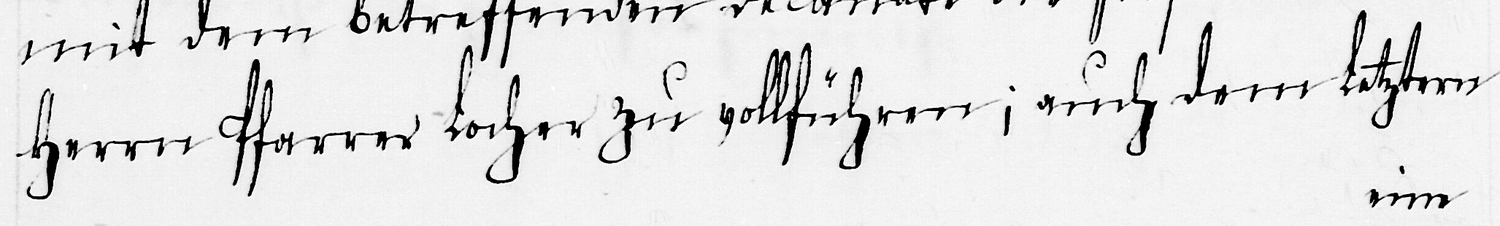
Herrn Pfarrer Locher zu vollführen; auch dem Letztern
